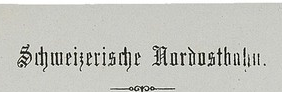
Schweizerische Nordostbahn.
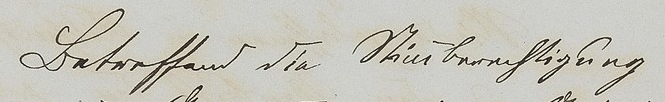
Betreffend die Stimmberechtigung
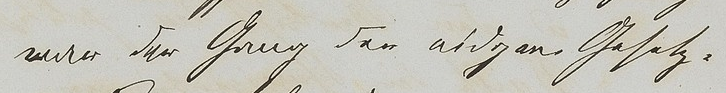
war der Gang der eidgen. Gesetz-
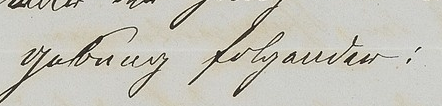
gebung folgender:
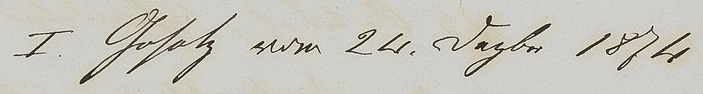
I. Gesetz vom 24. Dezbr 1874
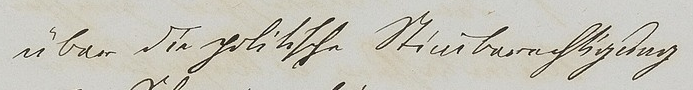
über die politische Stimmberechtigung
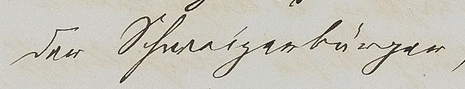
der Schweizerbürger,
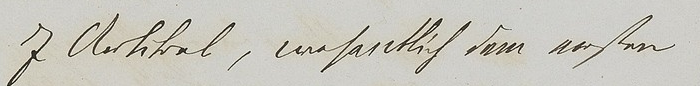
7 Artikel, wesentlich dem ersten
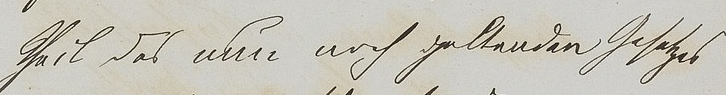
Theil des nun noch geltenden Gesetzes
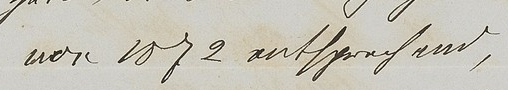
von 1872 entsprechend,
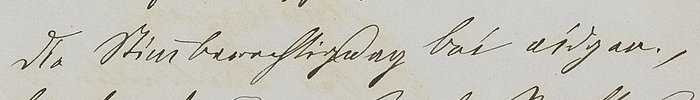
die Stimmberechtigung bei eidgen.,
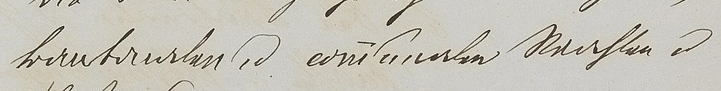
kantonalen u communalen Wahlen u
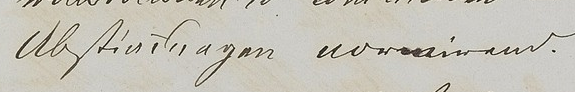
Abstimmungen normirend.
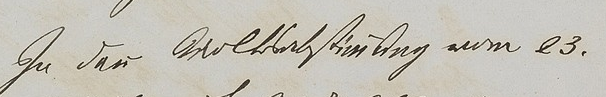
In der Volksabstimmung vom 23.
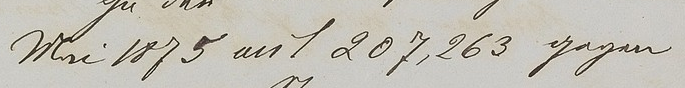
Mai 1875 mit 207,263 gegen
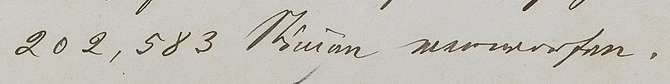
202,583 Stimmen verworfen.
